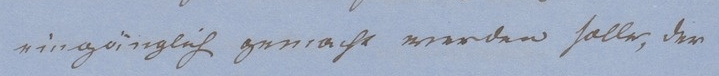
eingänglich gemacht werden solle, der
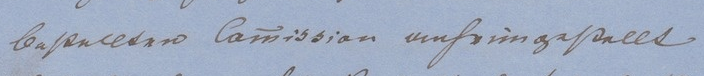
bestellten Comission anheimgestellt
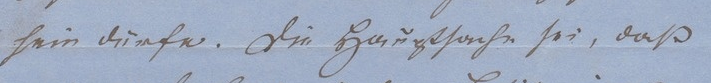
sein dürfe. Die Hauptsache sei, daß
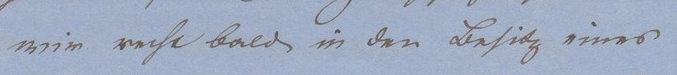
wir recht bald in den Besitz eines
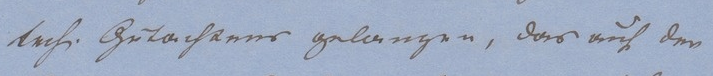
tech. Gutachtens gelangen, das auf der
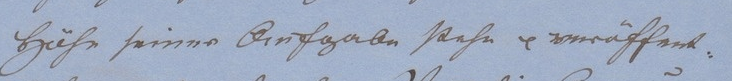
Höhe seiner Aufgabe stehe & veröffent-
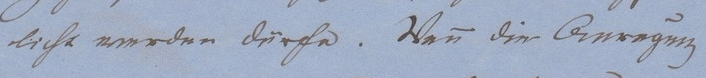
licht werden dürfe. Wenn die Anregung
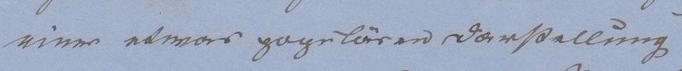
einer etwas populären Darstellung
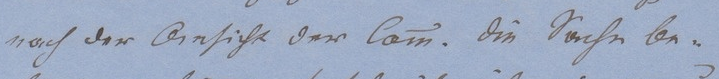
nach der Ansicht der Comm. die Sache be-
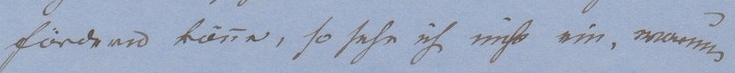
fördern könne, so sehe ich nicht ein, warum
